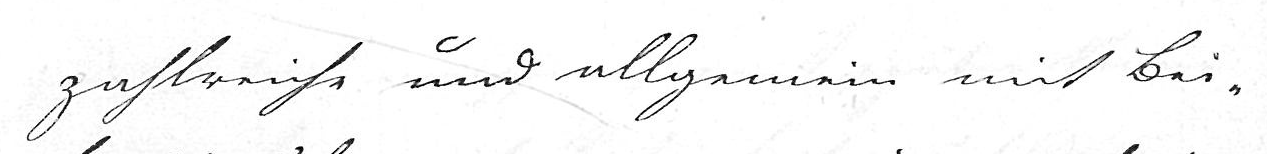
zahlreiche und allgemeine mit Bei-
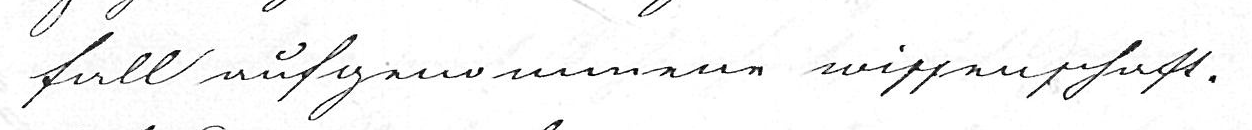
fall aufgenommene wissenschaft-
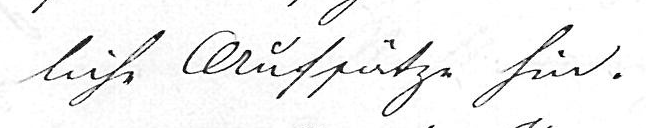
liche Aufsätze hin.
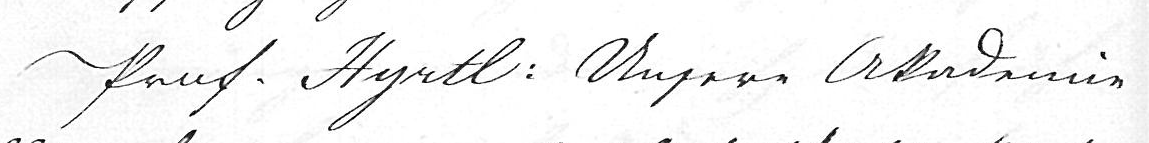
Prof. Hyrtl: Unsere Akademie
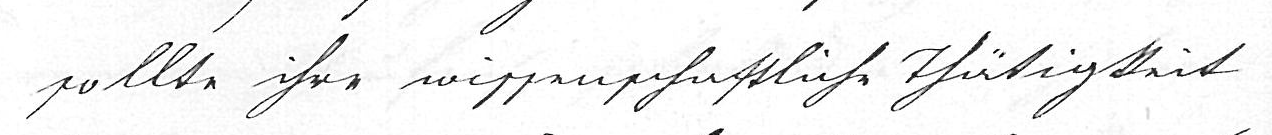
sollte ihre wissenschaftliche Thätigkeit
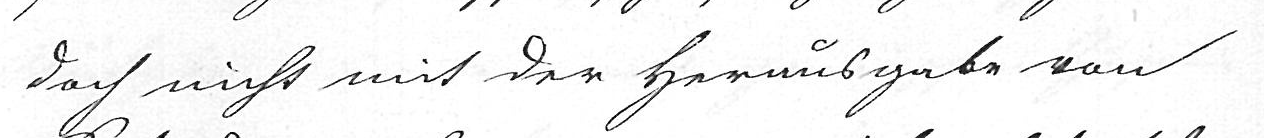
doch nicht mit der Herausgabe von
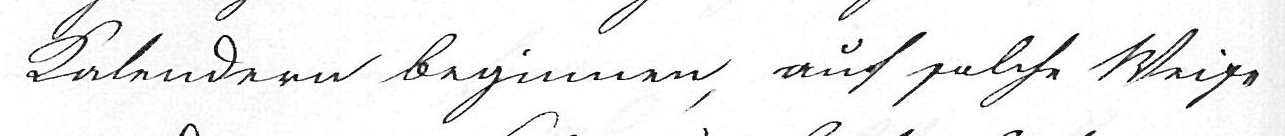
Kalendern beginnen, auf solche Weise
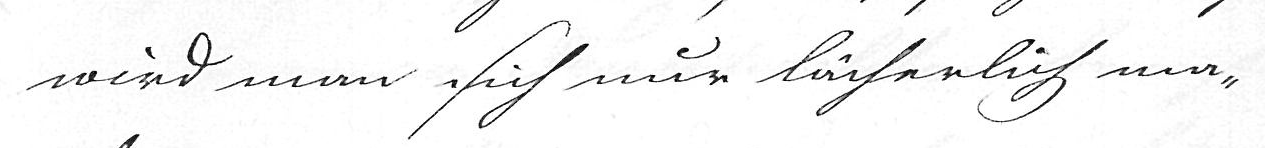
wird man sich nur lächerlich ma-
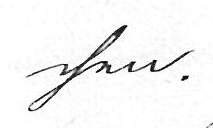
chen.
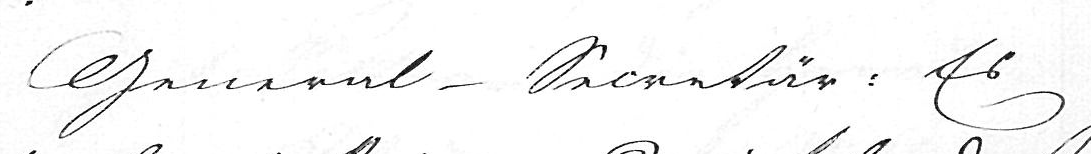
General-Secretär: Es
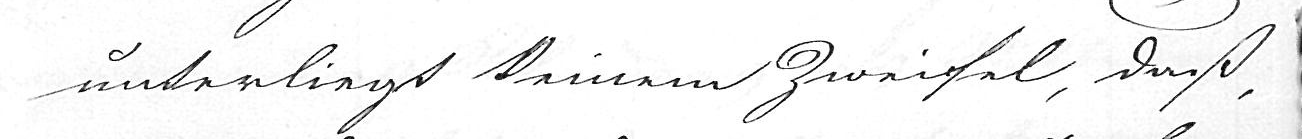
unterliegt keinem Zweifel, daß
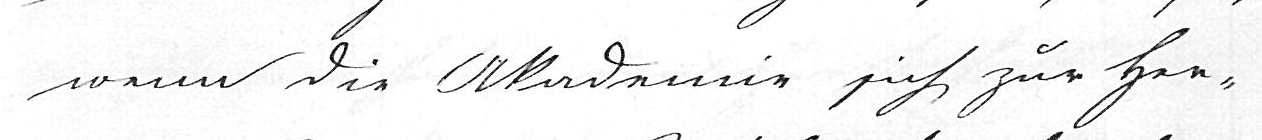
wenn die Akademie sich zur Her-
